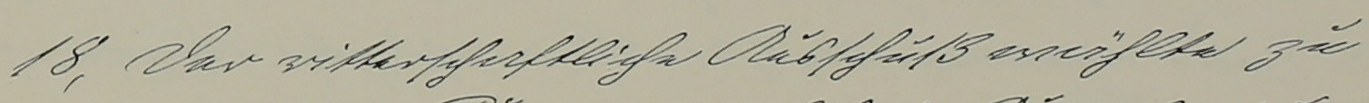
18. Der ritterschaftliche Ausschuß erwählte zu
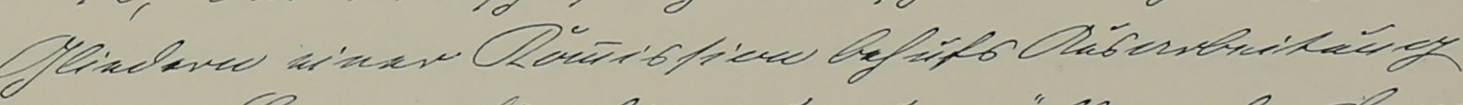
Gliedern einer Kommission behufs Ausarbeitung
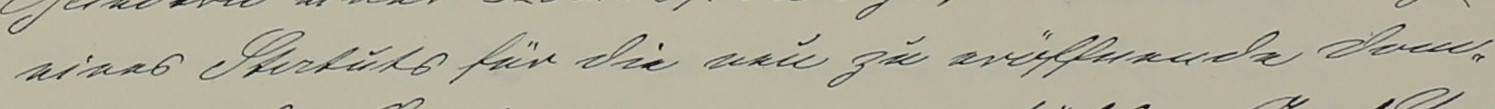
eines Statuts für die neu zu eröffnende Dom-
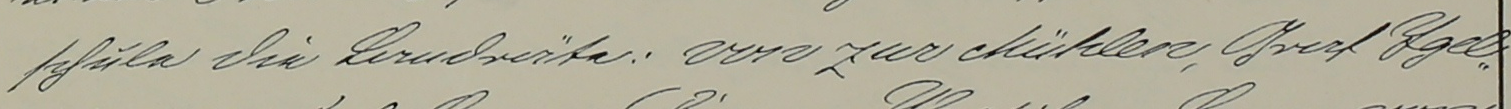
schule die Landräte: von zur Mühlen, Graf Igel-
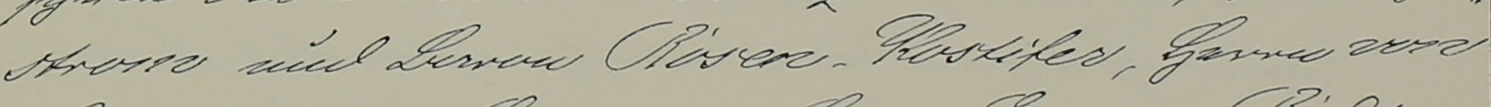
strom und Baron Rosen-Kostifer; Herrn von
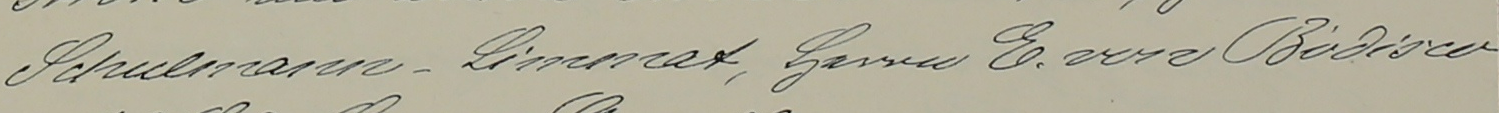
Schulmann-Limmat, Herrn E. von Bodisco
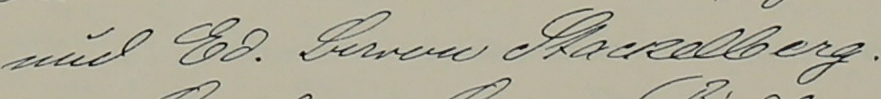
und Ed. Baron Stackelberg.
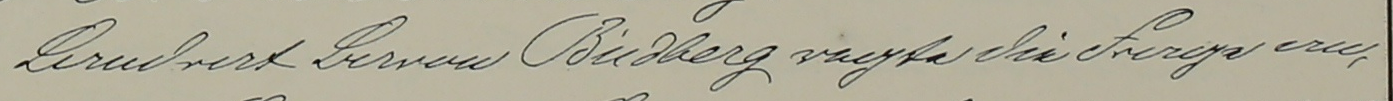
Landrat Baron Budberg regte die Frage an,
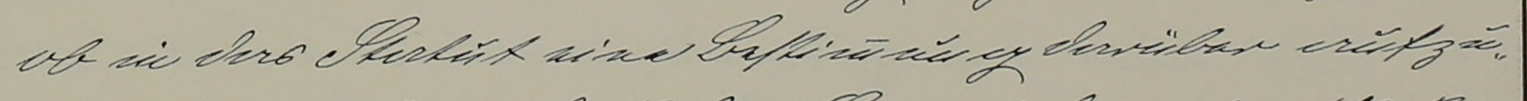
ob in das Statut eine Bestimmung darüber aufzu-
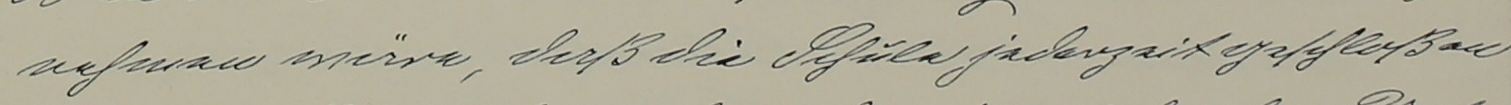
nehmen wäre, daß die Schule jederzeit geschloßen
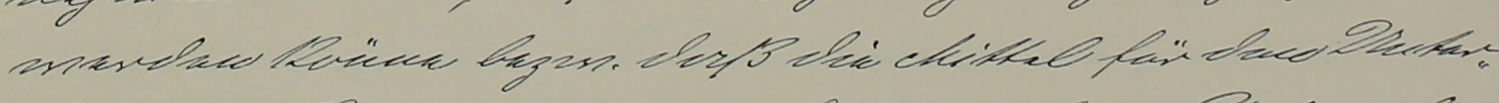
werden könne bezw. die Mittel für den Unter-
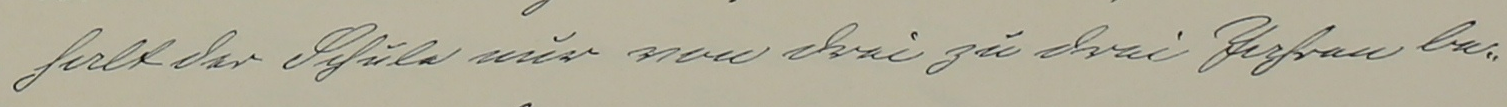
halt der Schule nur von drei zu drei Jahren be-
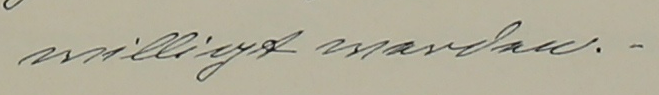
willigt werden. -
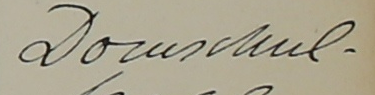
Domschul-
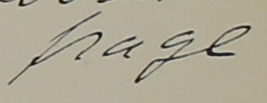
frage
